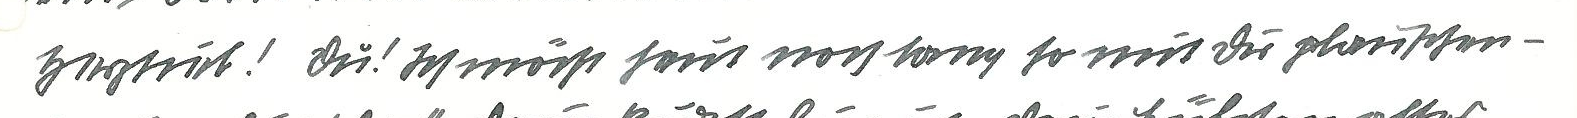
Herzlieb! Du! Ich möcht heut noch lang so mit Dir plauschen –
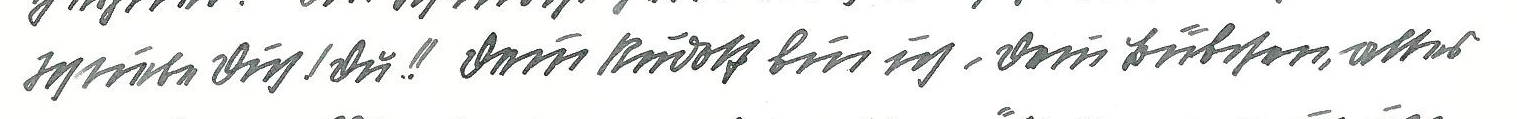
Ich liebe Dich! Du!! Dein bin ich, Dein Bübchen, alles
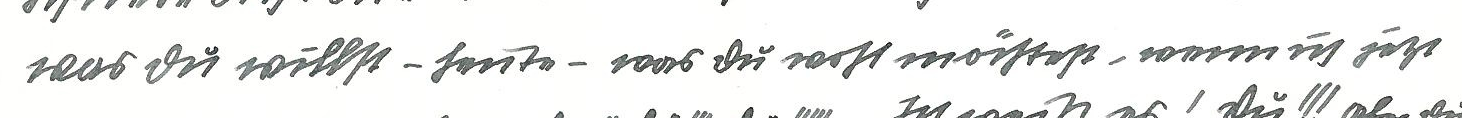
was Du willst – heute – was Du wohl möchtest, wenn ich jetzt
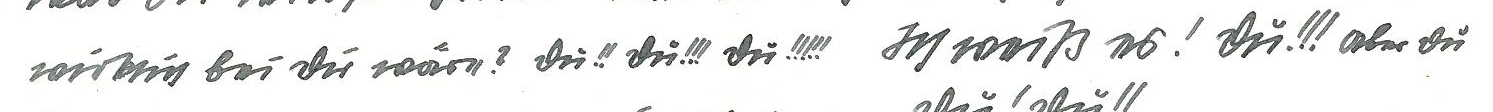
wirklich bei Dir wäre? Du!! Du!!! Du!!!!! Ich weiß es! Du!!! Aber Du
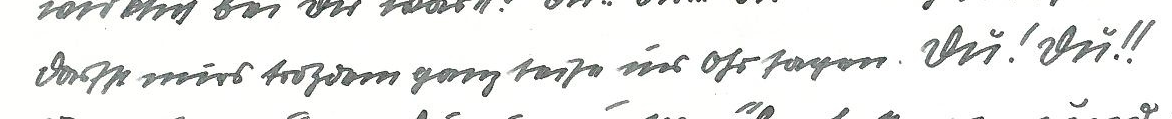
darfst mirs trotzdem ganz leise ins Ohr sagen. Du! Du!!
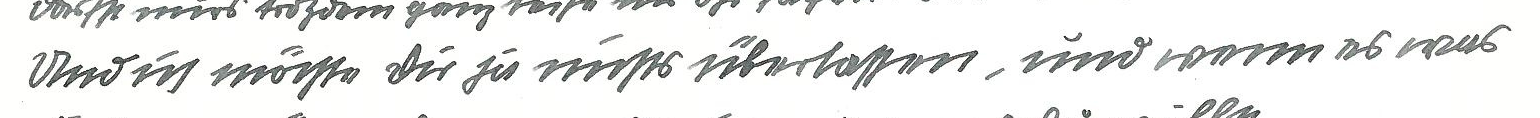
Und ich möchte Dir ja nichts überlassen, und wenn es was
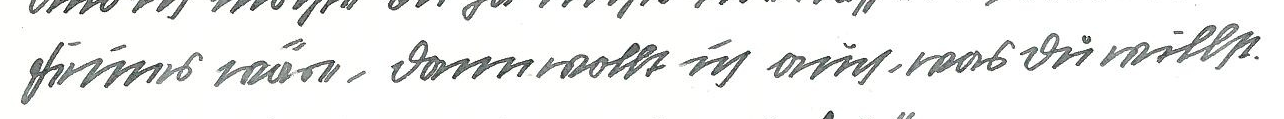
Feines wäre, dann wollt ich auch was Du willst.
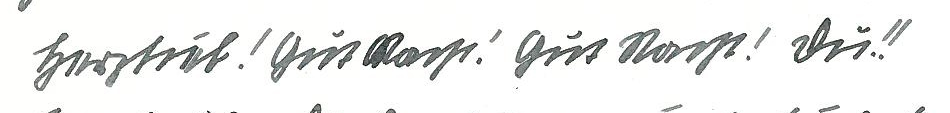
Herzlieb! Gut Nacht! Gut Nacht! Du!!
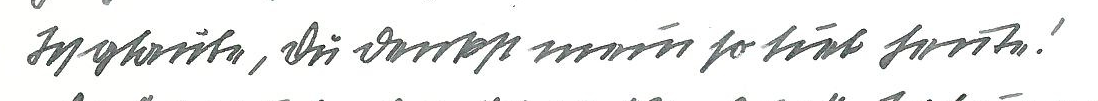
Ich glaube, Du denkst mein so lieb heute!
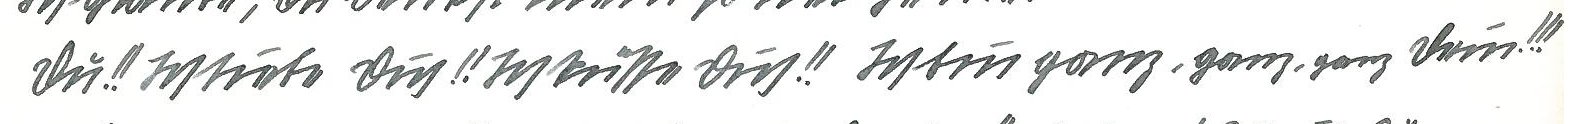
Du!! Ich liebe Dich!! Ich küsse Dich!! Ich bin ganz, ganz, ganz Dein!!!
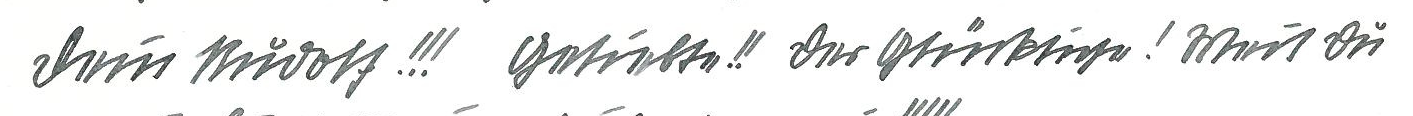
Dein !!! Geliebte!! Der Glückliche! Weil Du
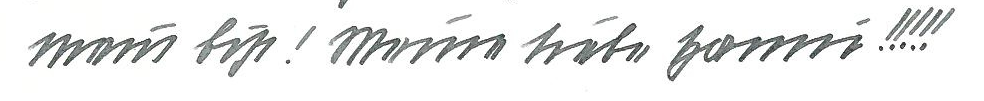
mein bist! Meine liebe, liebe !!!!!
